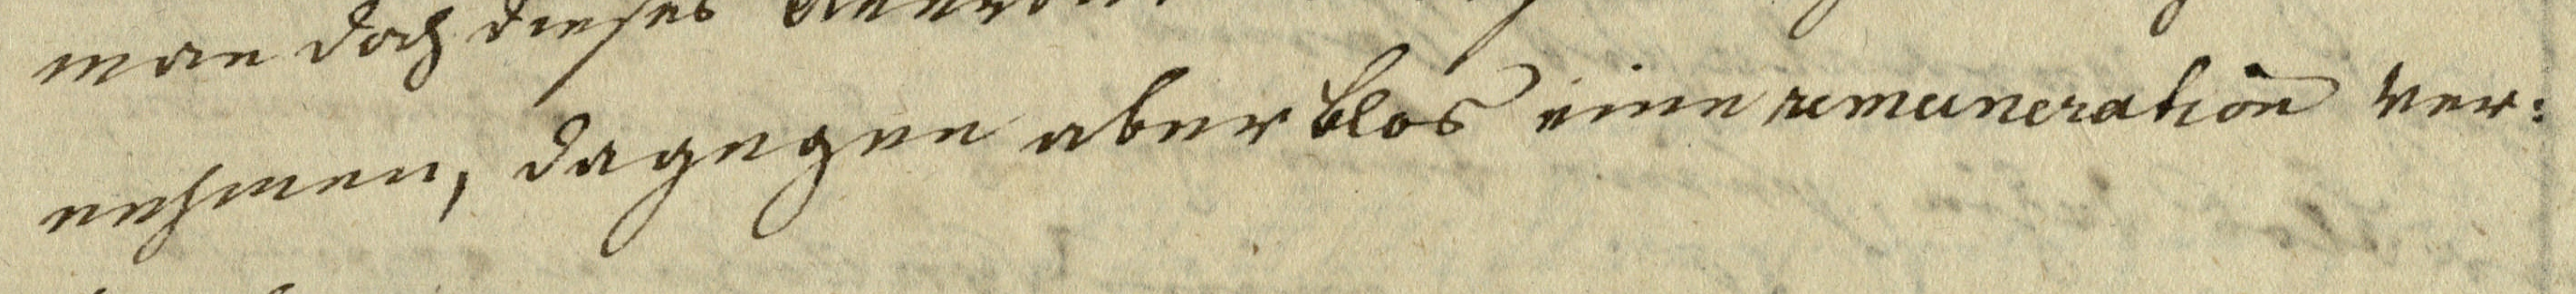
nehmen, dagegen aber blos eine remuneration ver¬
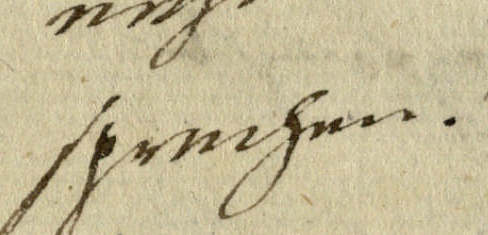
sprechen.
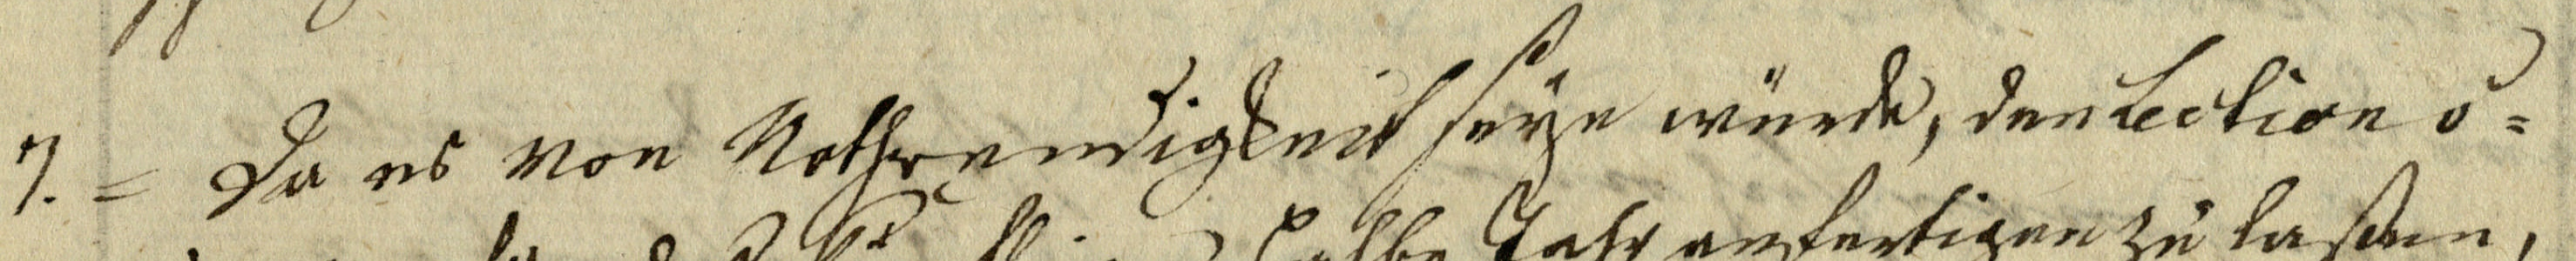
7. Da es von Nothwendigkeit seÿn würde, den Lections-
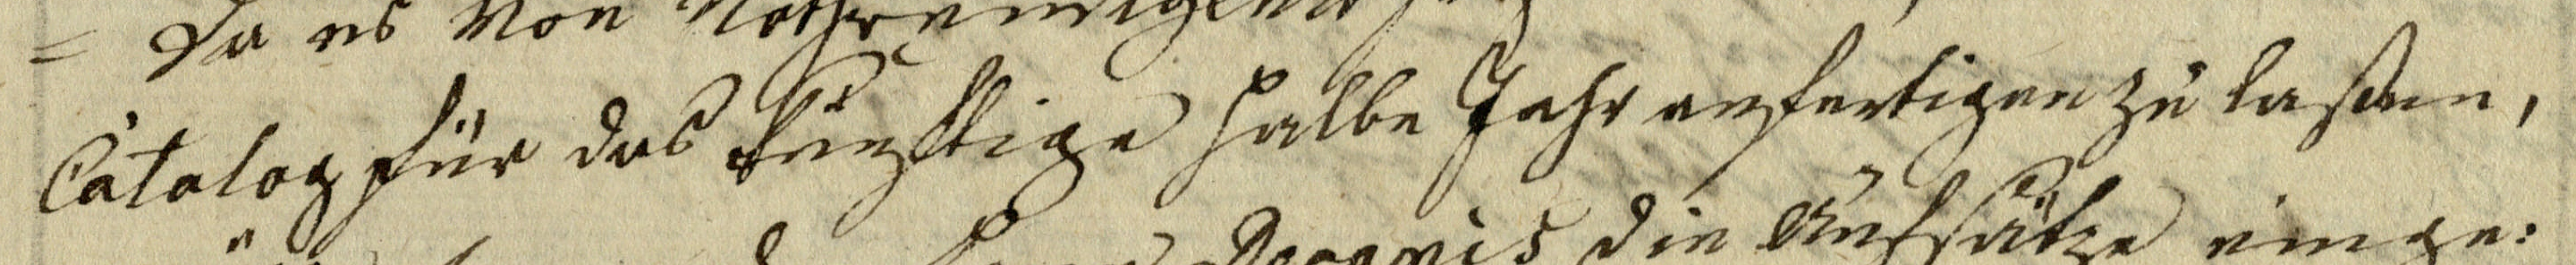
Catalog für das künftige halbe Jahr anfertigen zu laßen,
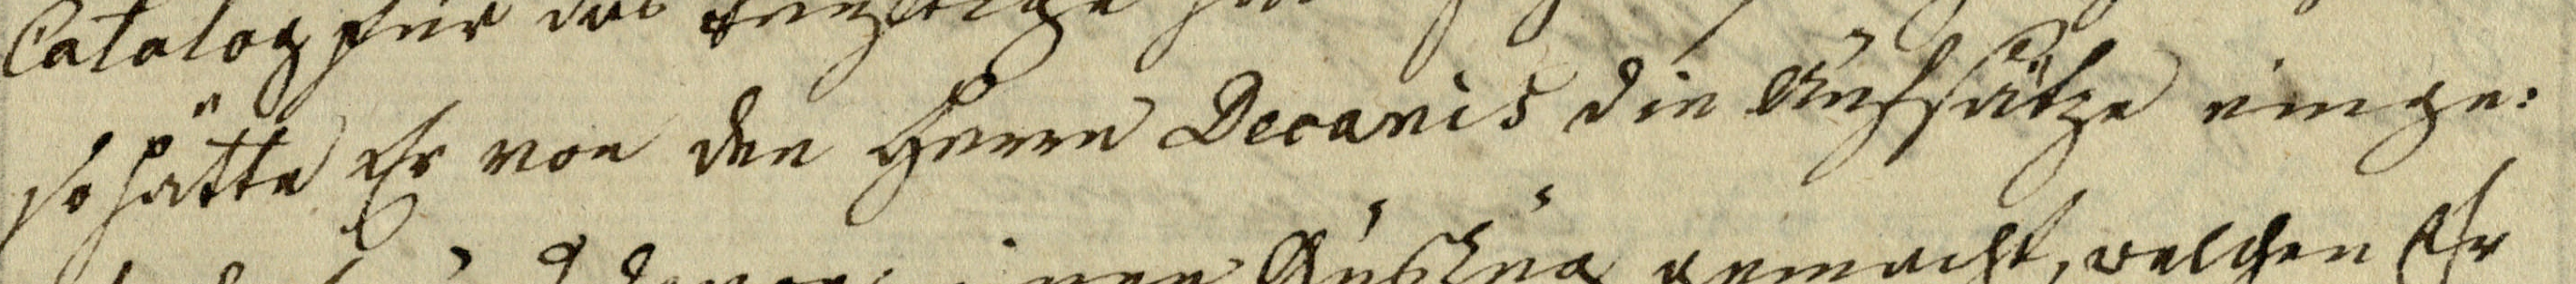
so hätte Er von den Herrn Decanis die Aufsätze einge¬
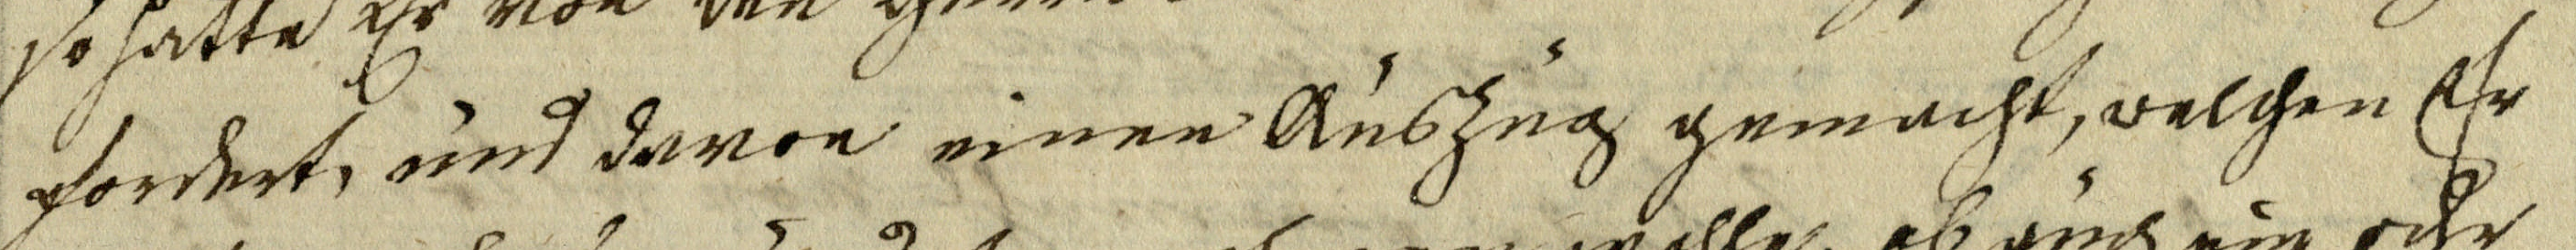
fordert, und davon einen Auszug gemacht, welchen Er
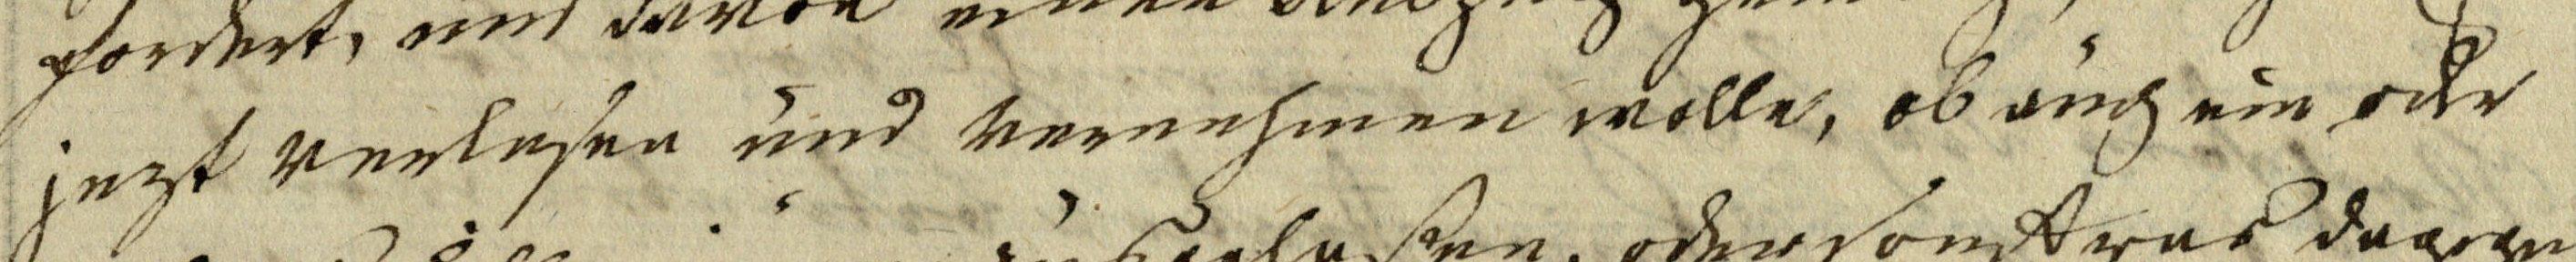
jezt verlesen und vernehmen wolle, ob auch ein oder
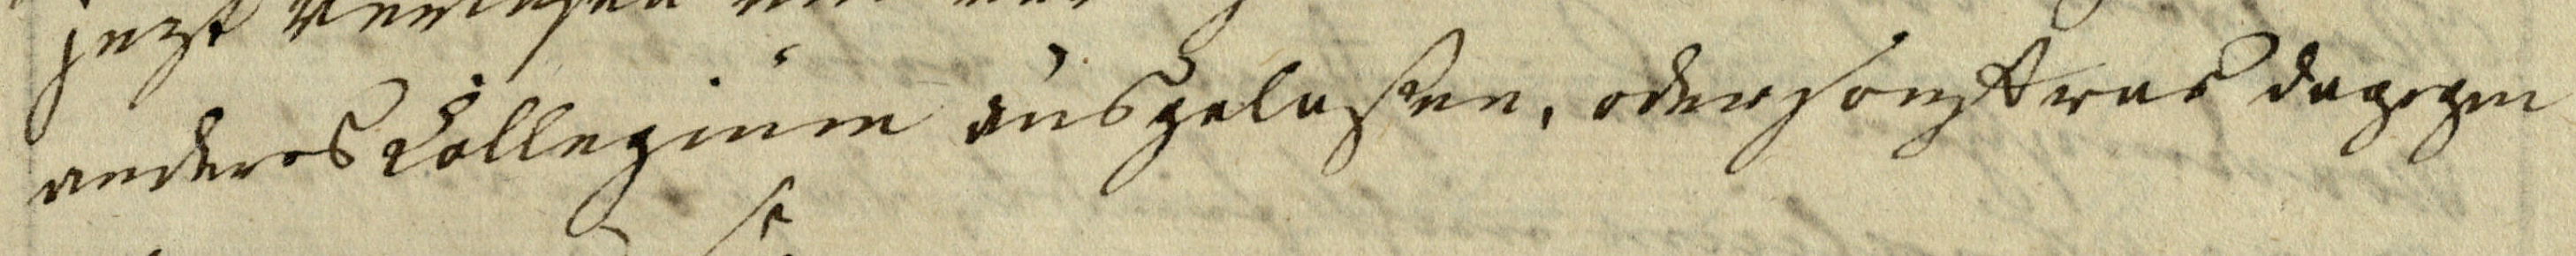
anderes Collegium ausgelaßen, oder sonst was dagegen
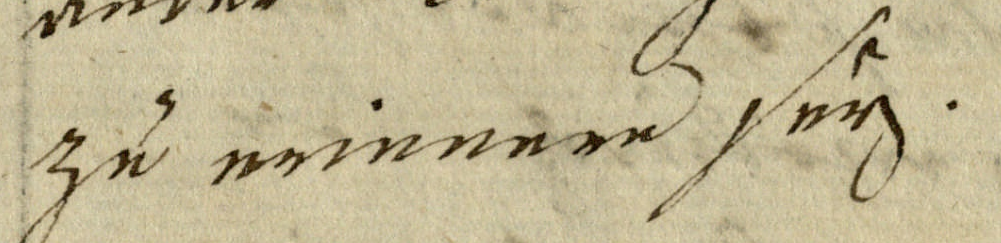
zu erinnern seÿ.
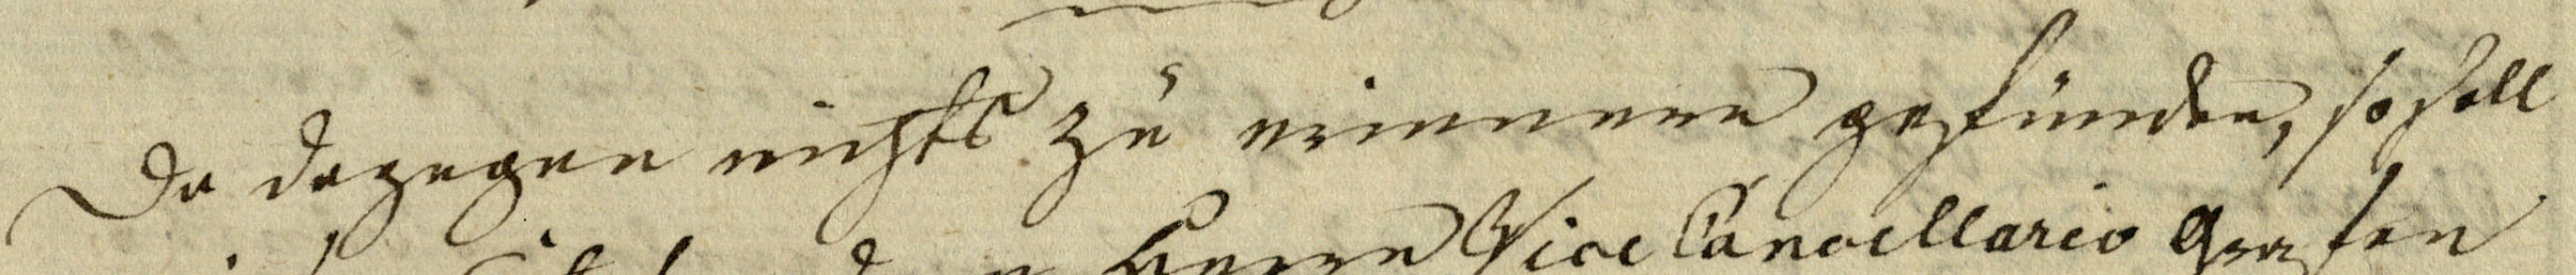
Da dagegen nichts zu erinnern gefunden, so soll
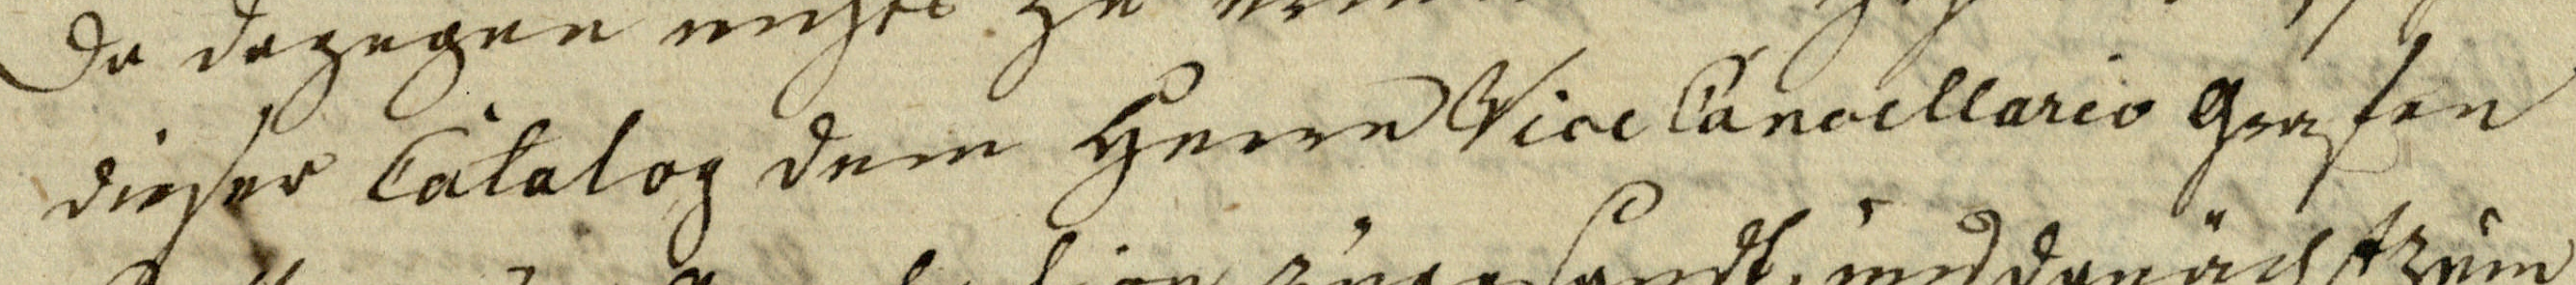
dieser Catalog dem Herrn Vice Cancellario Grafen
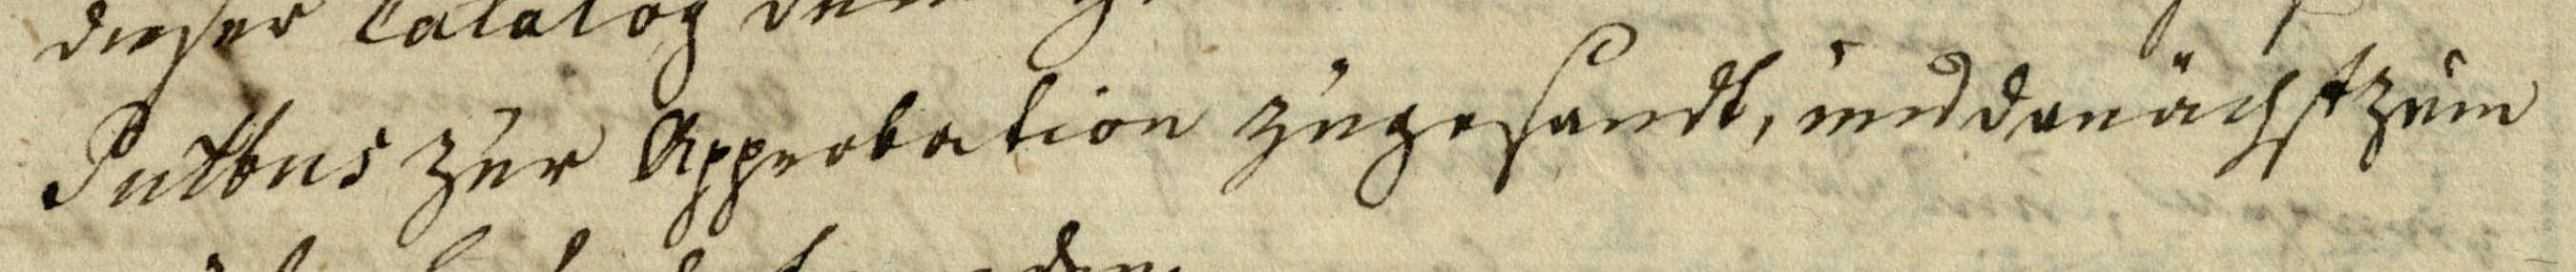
Putbus zur Approbation zugesandt, und danächstzum
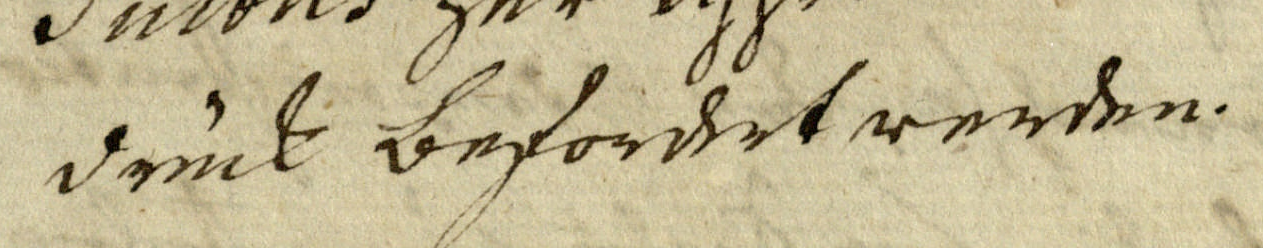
Druck befördert werden.
